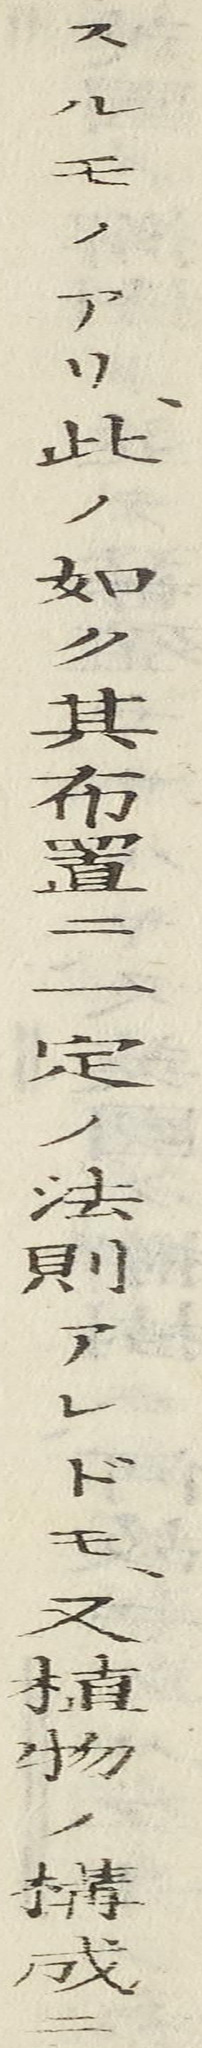スルモノアリ、此ノ如ク其布置ニ一定ノ法則アレドモ、又植物ノ構成ニ
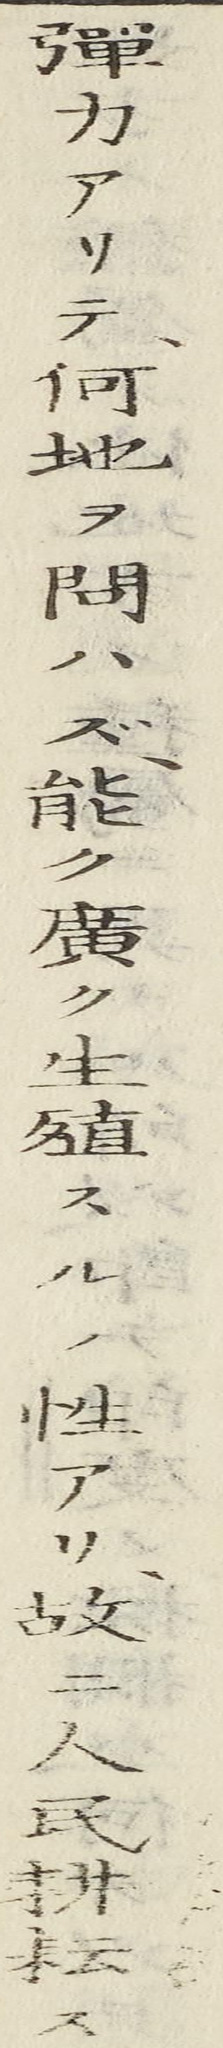弾力アリテ、何地ヲ問ハズ、能ク広ク生殖スルノ性アリ、故ニ人民耕耘ス
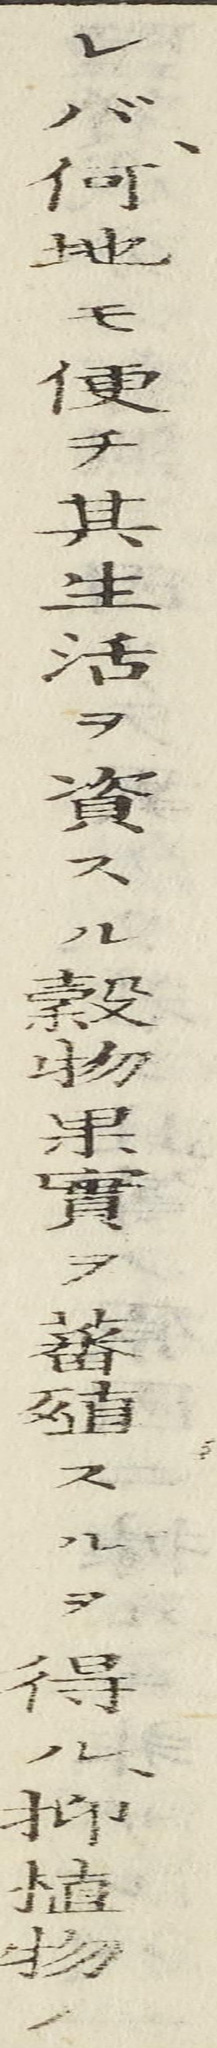レバ、何地モ便チ其生活ヲ資スル穀物果実ヲ蕃殖スルヲ得ル、抑植物ノ
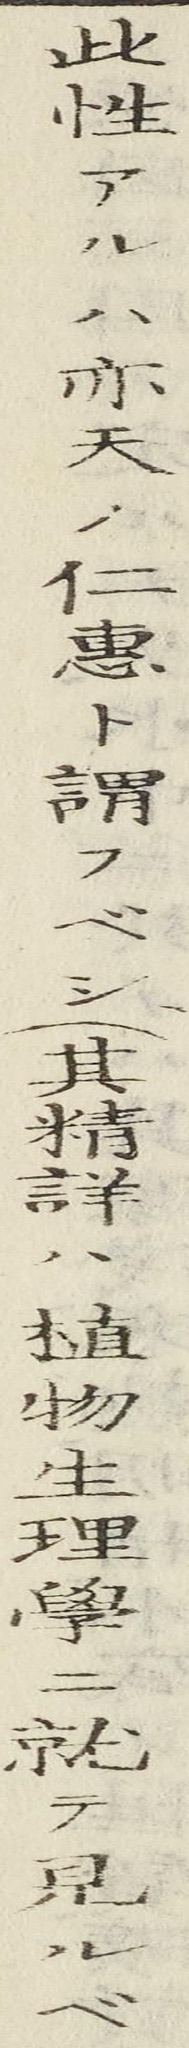此性アルハ亦天ノ仁恵ト謂フベシ、（其精詳ハ植物生理学ニ就テ見ルベ
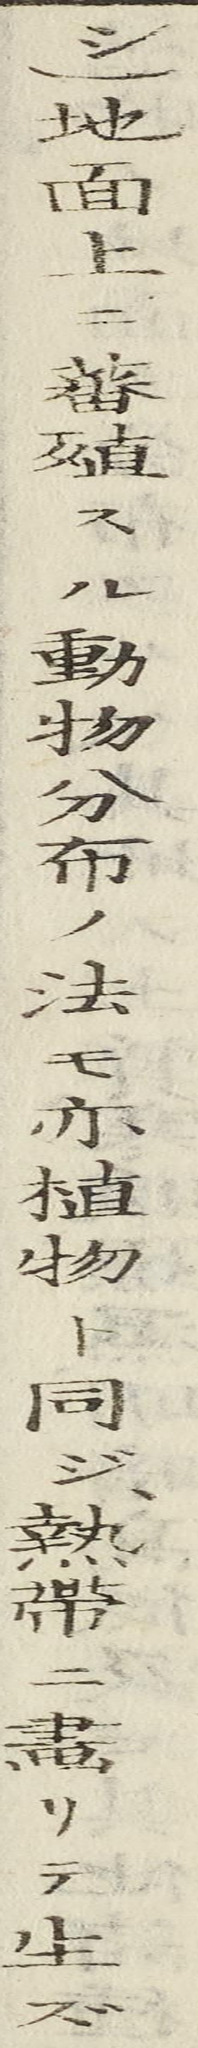シ）地面上ニ蕃殖スル動物分布ノ法モ亦植物ト同ジ、熱帯ニ画リテ生ズ
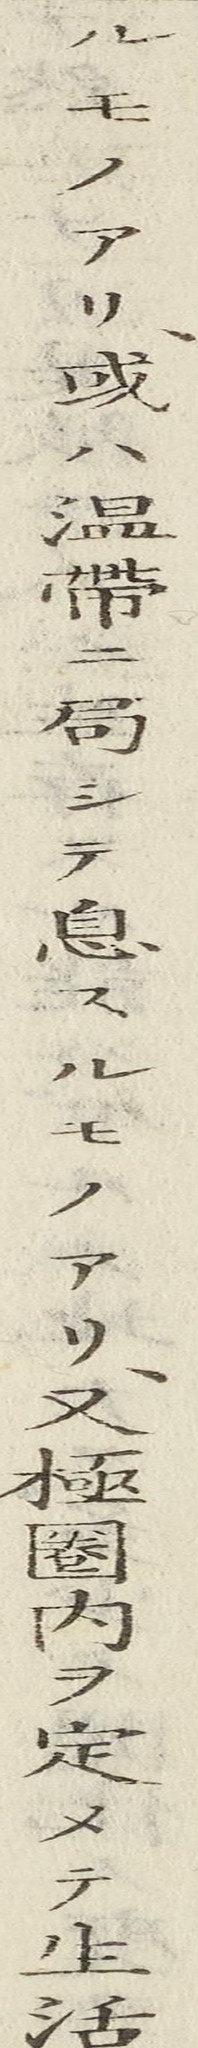ルモノアリ、或ハ温帯ニ局シテ息スルモノアリ、又極圏内ヲ定メテ生活
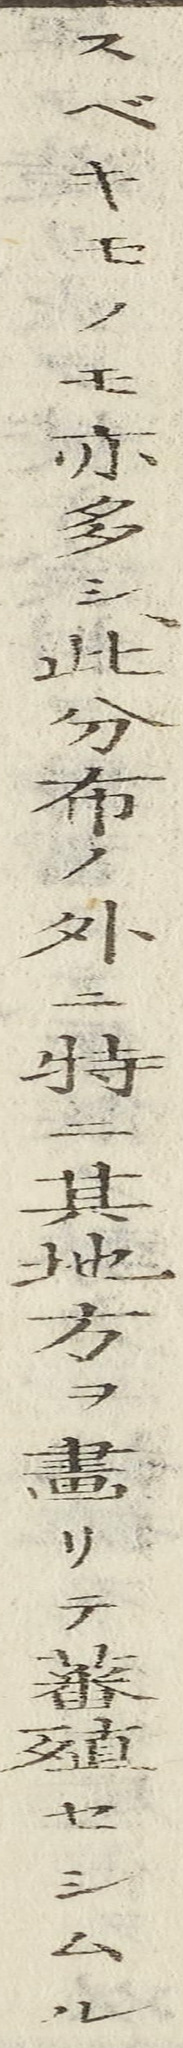スベキモノ亦多シ、此分布ノ外ニ特ニ其地方ヲ画リテ蕃殖セシムル
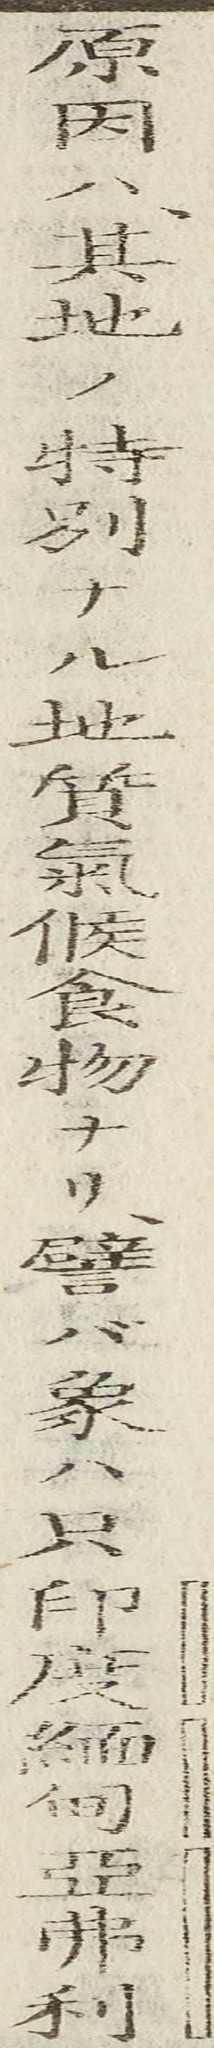原因ハ、其地ノ特別ナル地質気候食物ナリ、譬バ象ハ只印度緬甸阿弗利
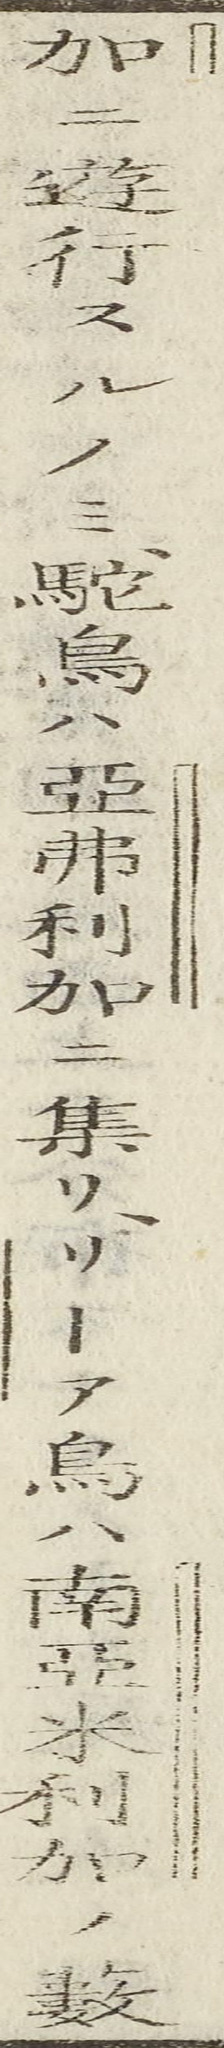加ニ遊行スルノミ、駝鳥ハ阿弗利加ニ集リ、リーア鳥ハ南亜米利加ノ薮
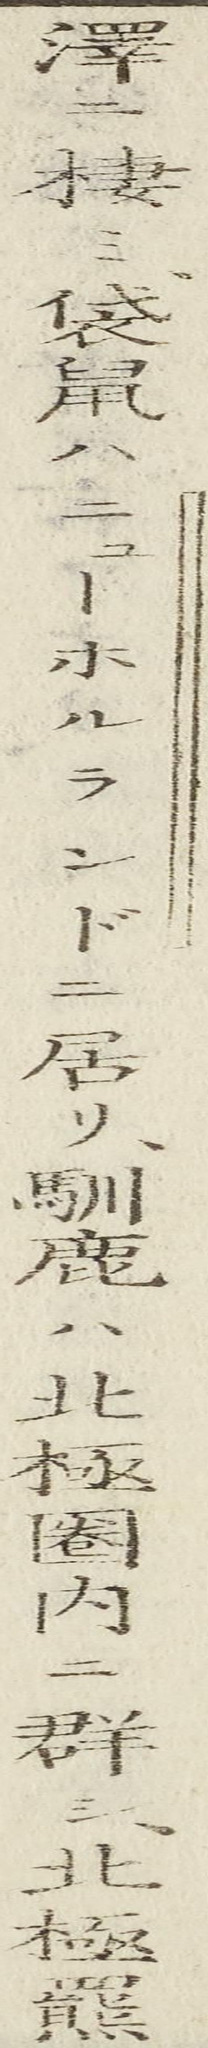沢ニ棲ミ、袋鼠ハニューホルランドニ居リ、馴鹿ハ北極圏内ニ群シ、北極熊
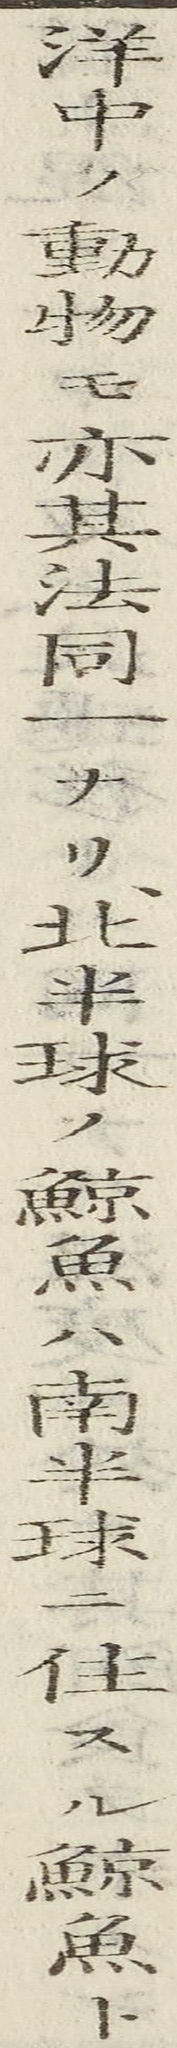洋中ノ動物モ亦其法同一ナリ、北半球ノ鯨魚ハ南半球ニ住スル鯨魚ト
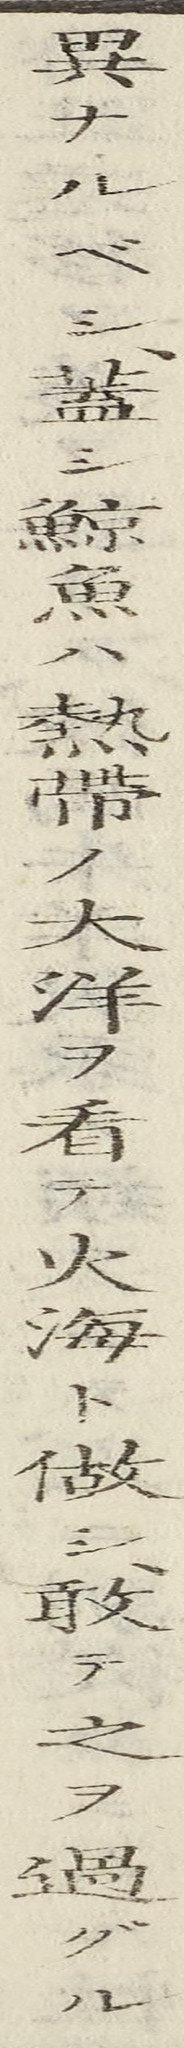異ナルベシ、蓋シ鯨魚ハ熱帯ノ大洋ヲ看テ火海ト做シ、敢テ之ヲ過グル
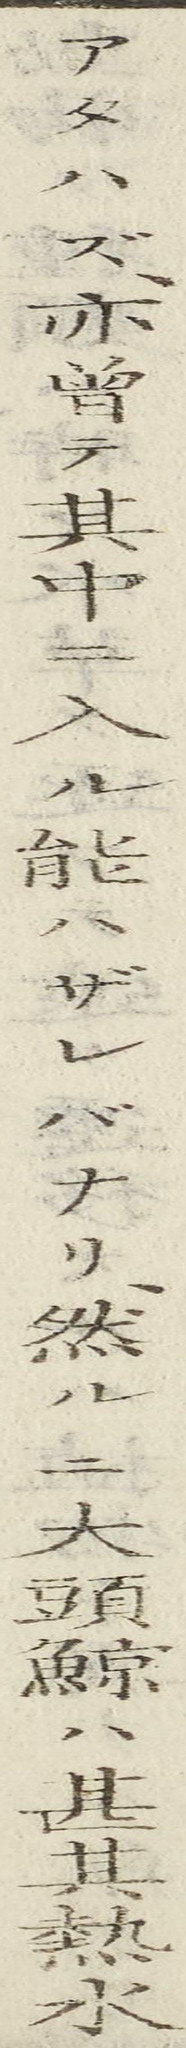アタハズ、亦嘗テ其中ニ入ル能ハザレバナリ、然ルニ大頭鯨ハ甚其熱水
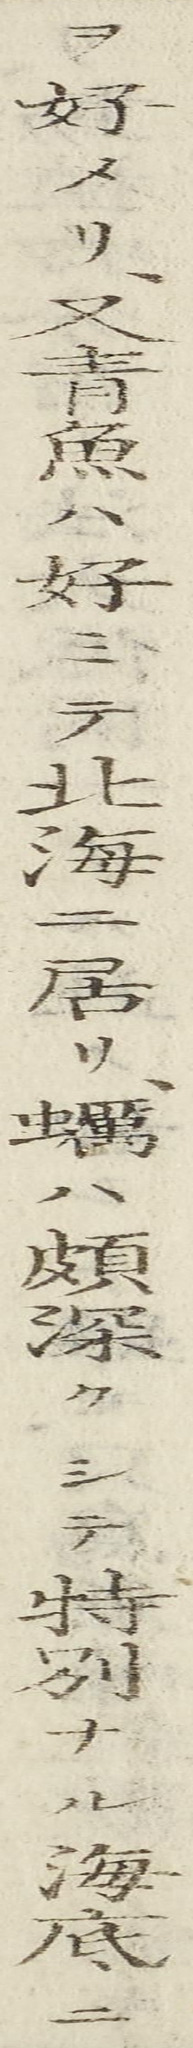ヲ好メリ、又青魚ハ好ミテ北海ニ居リ、蠣ハ頗深クシテ特別ナル海底ニ
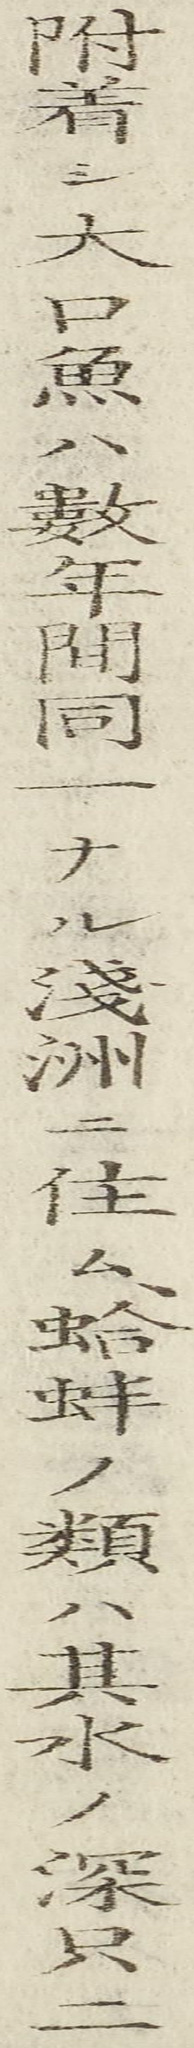附着シ大口魚ハ数年間同一ナル浅洲ニ住ム、蛤蚌ノ類ハ其水ノ深只ニ
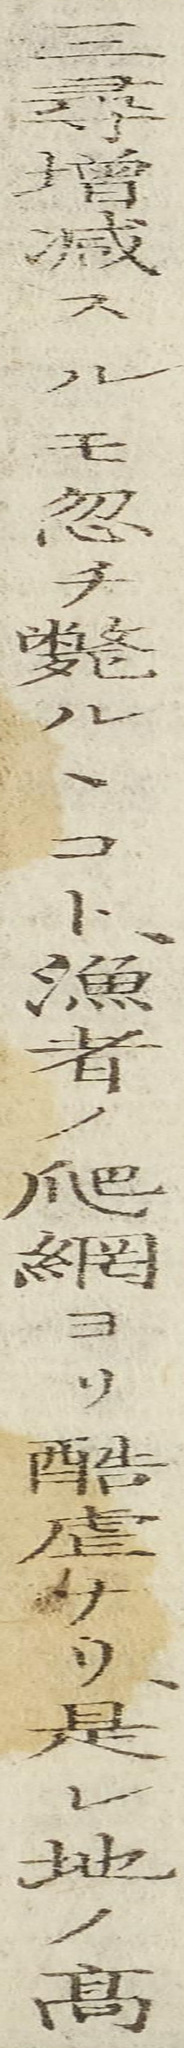三尋増減スルモ忽チ斃ルヽコト、漁者ノ爬網ヨリ酷虐ナリ、是レ地ノ高
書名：百科全書　地文學　全
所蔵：東京大学地震研究所図書室 Earthquake Research Institute Library, The University of Tokyo, JAPAN
